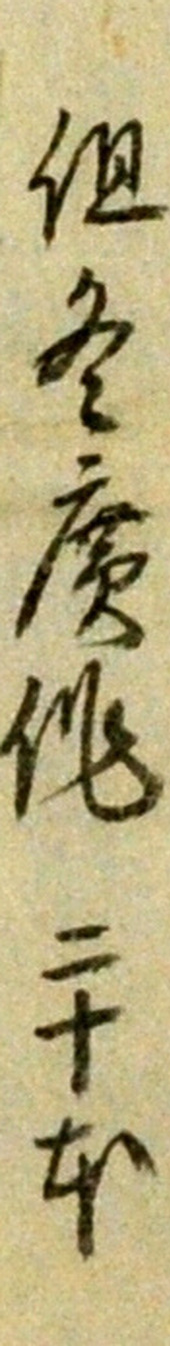但冬広作二十本
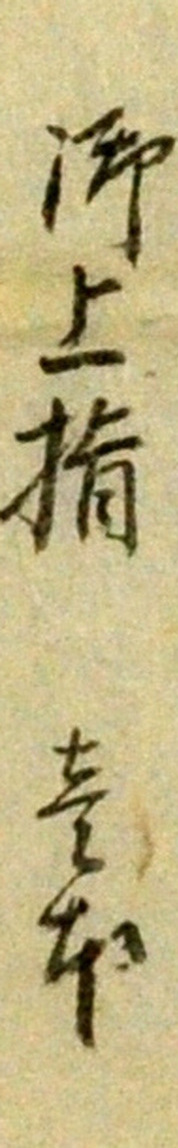御上指壱本
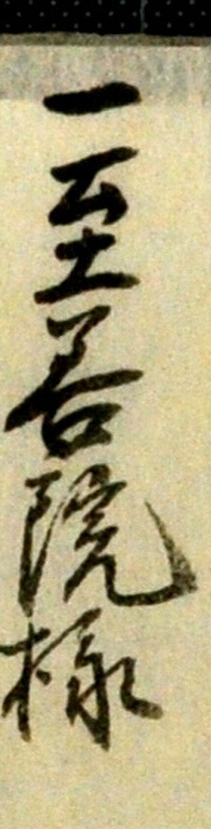一至善院様
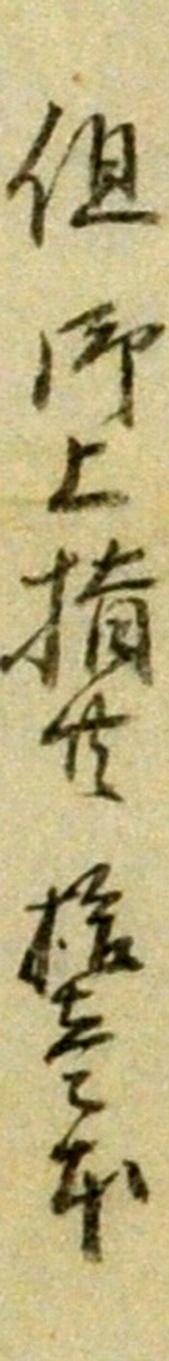但御上指共拾壱本
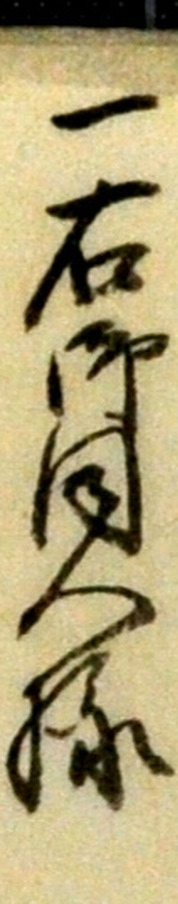一右御同人様
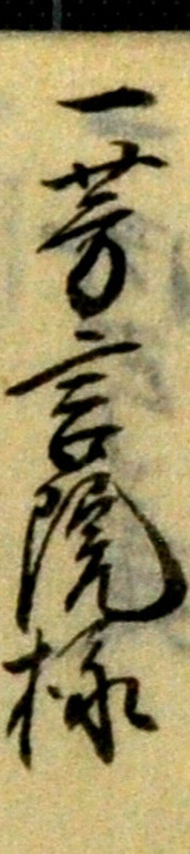一慎護院様

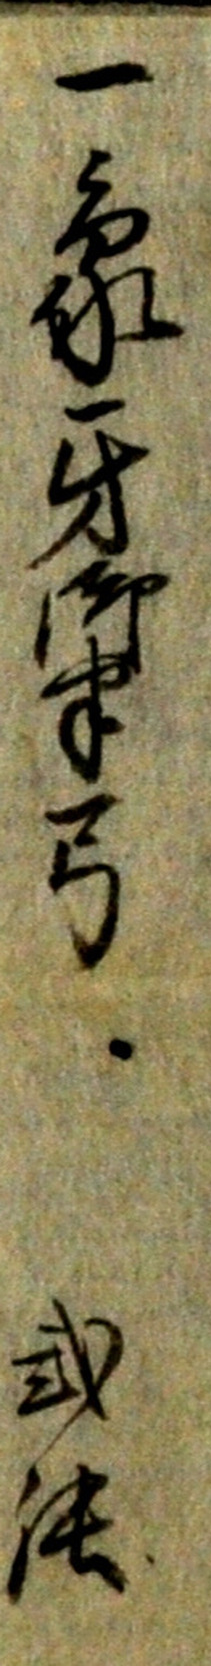一象牙御半弓弐張
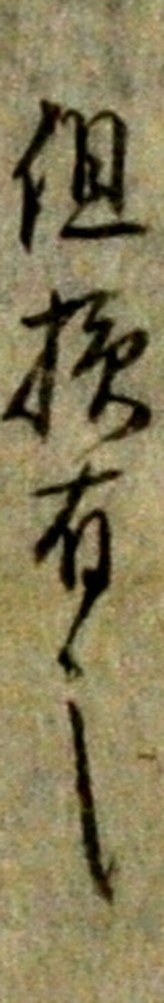但損有之
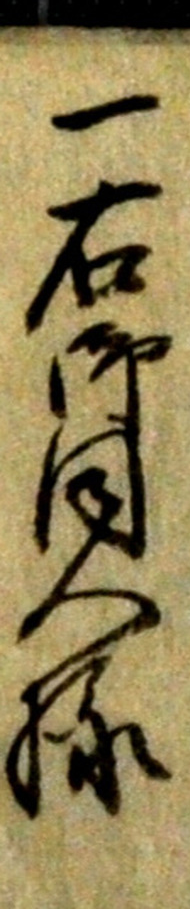一右御同人様
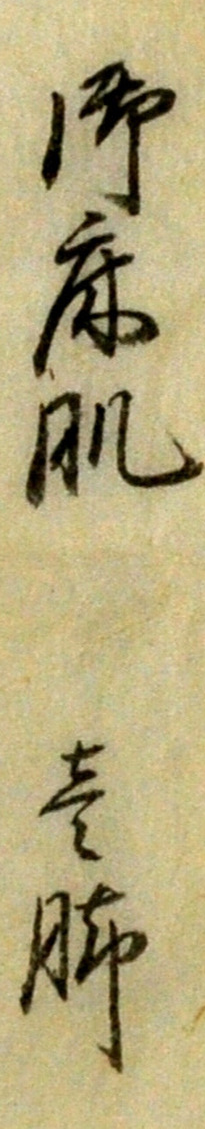御麻肌壱脚
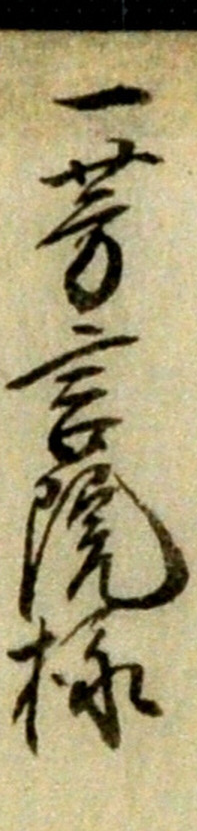一芳言院様
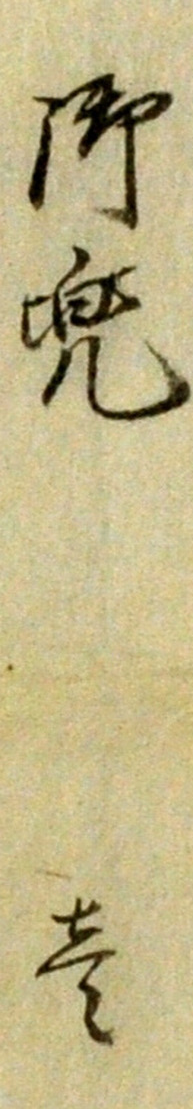御兜壱
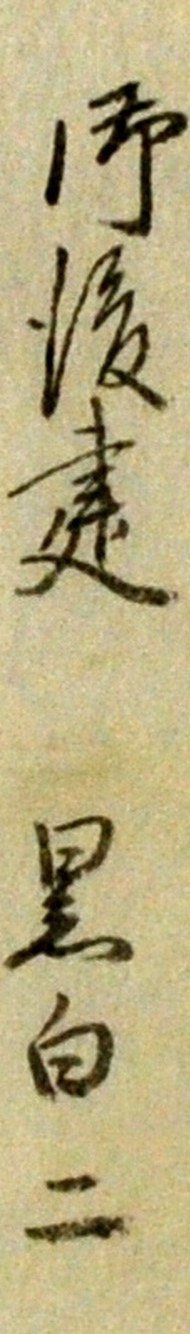御後建黒白二
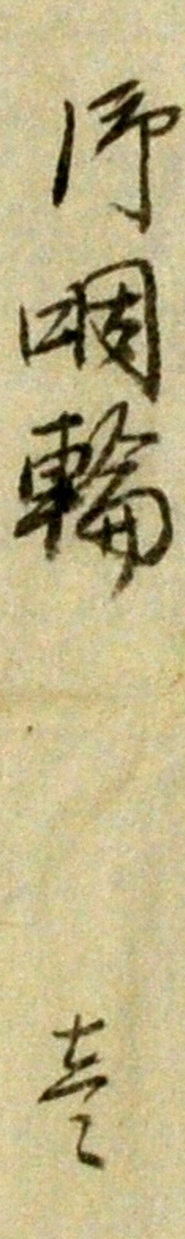御咽輪壱
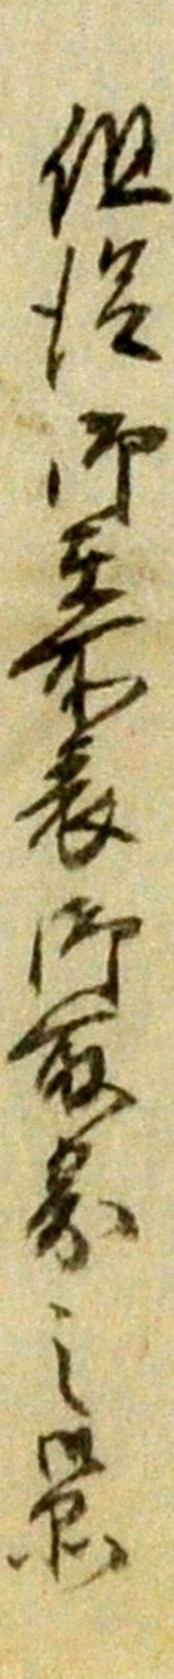但従御在所表御取寄之御品
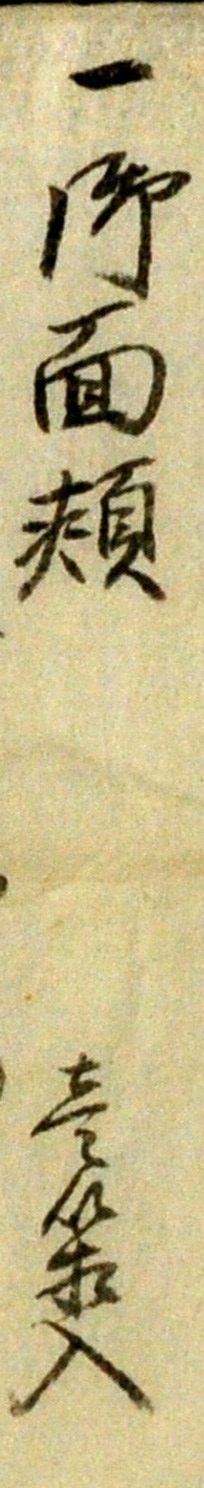一御面頬壱箱入
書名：目録
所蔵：伊那市立高遠町図書館・合同会社AMANE
